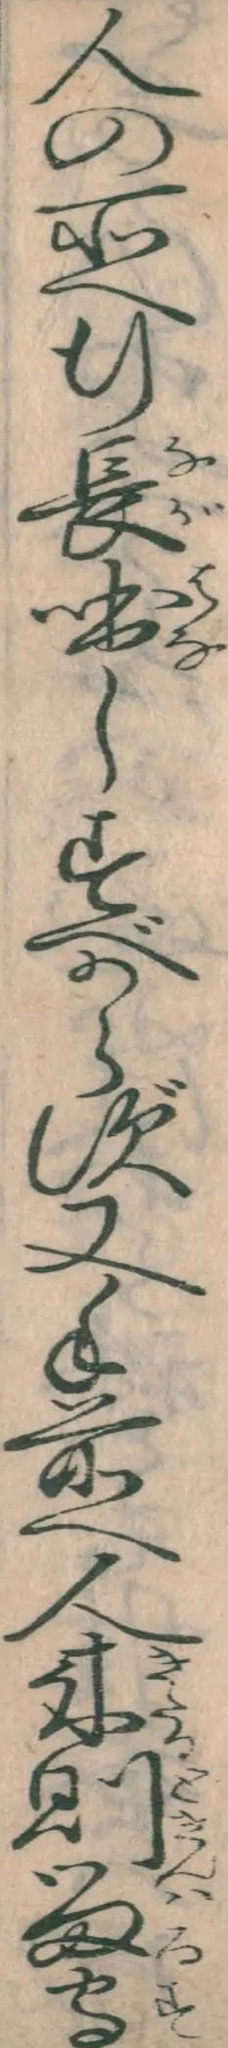人の所へ行長咄しすべからず又手前へ人来則留守

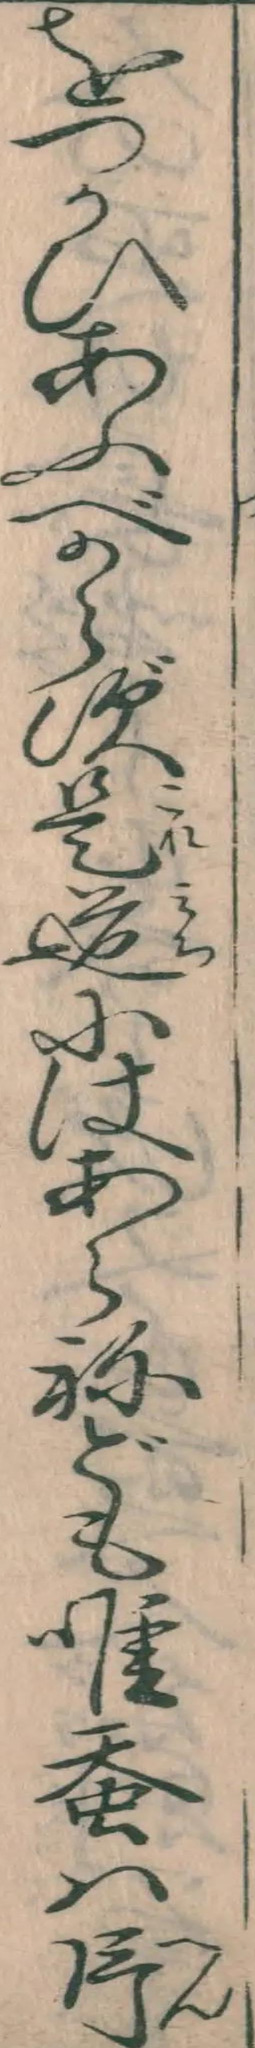をつかひあふべからず是道にはあらねども唯蚕は片
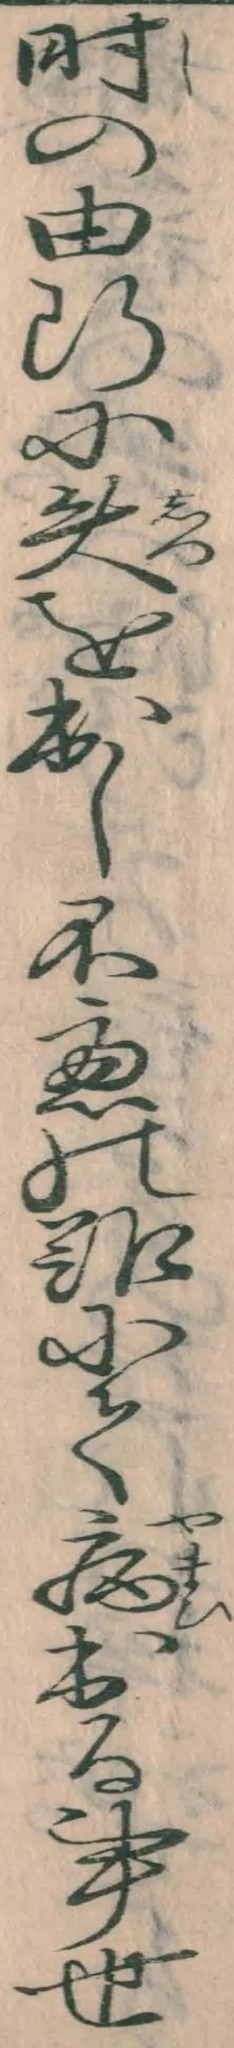時の油断に失を出し不慮の難にて病出る事世
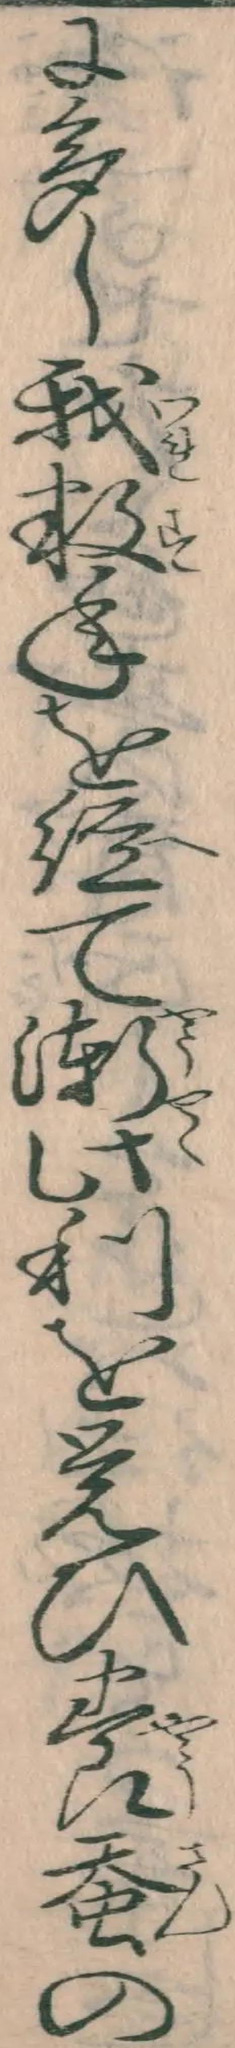に多し我数年を経て漸此利を覚ひ養蚕の
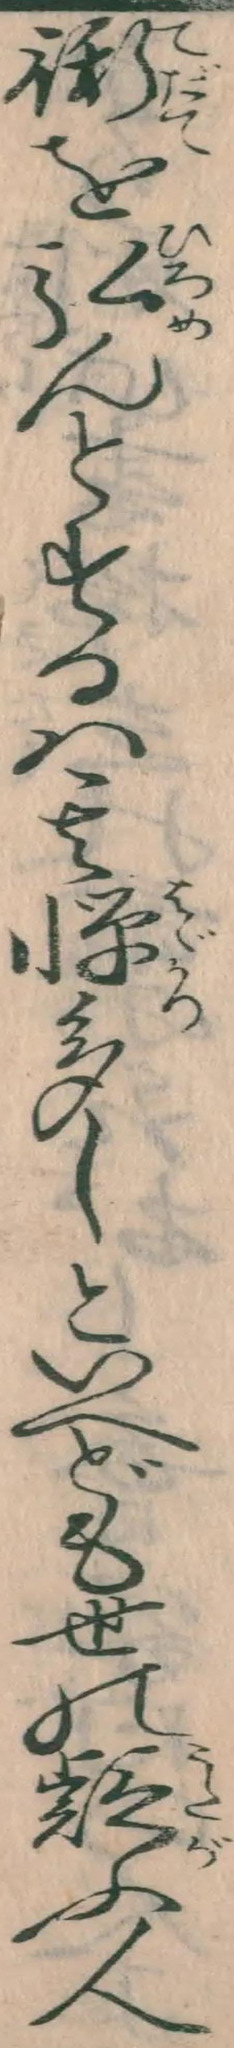術を弘んとするは其憚多しといへども世の疑ふ人
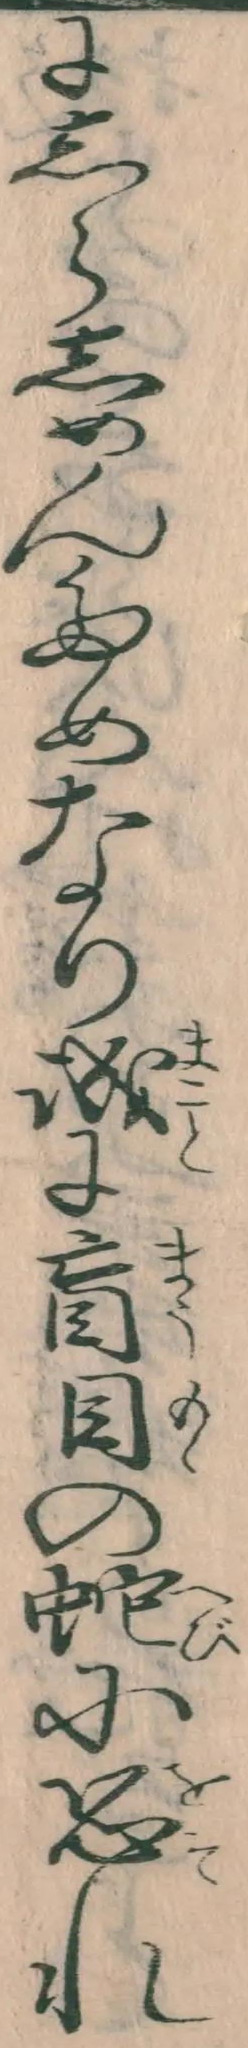にしらしめんためなり誠に盲目の蛇に恐れ
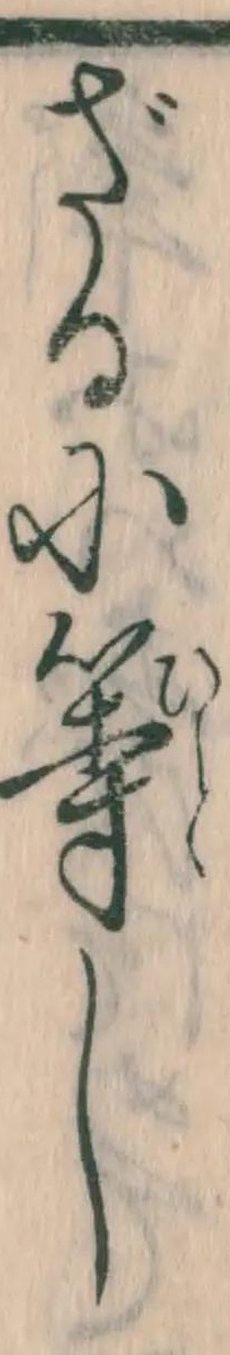ざるに等し
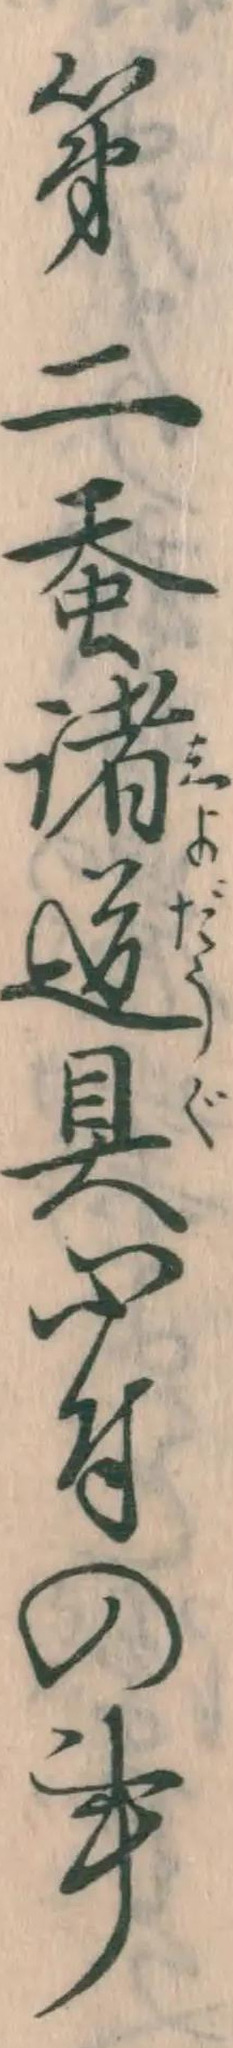第二蚕諸道具心付の事
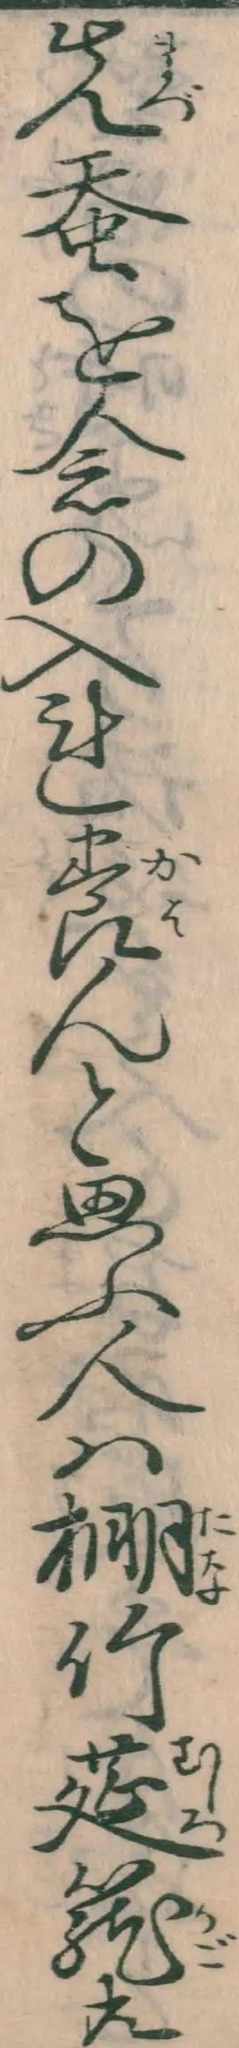先蚕を念の入れ養んと思ふ人は棚竹筵籠共
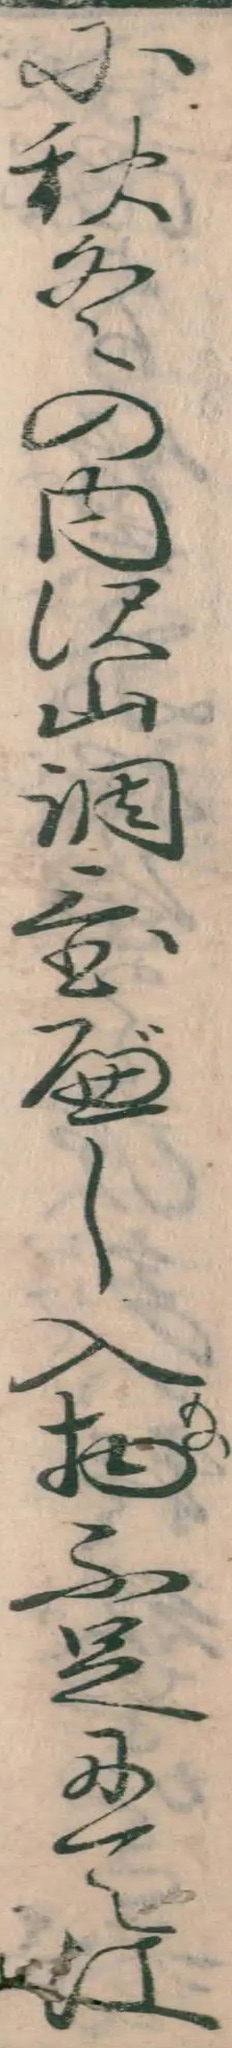に秋冬の内沢山調置べし入物不足にては
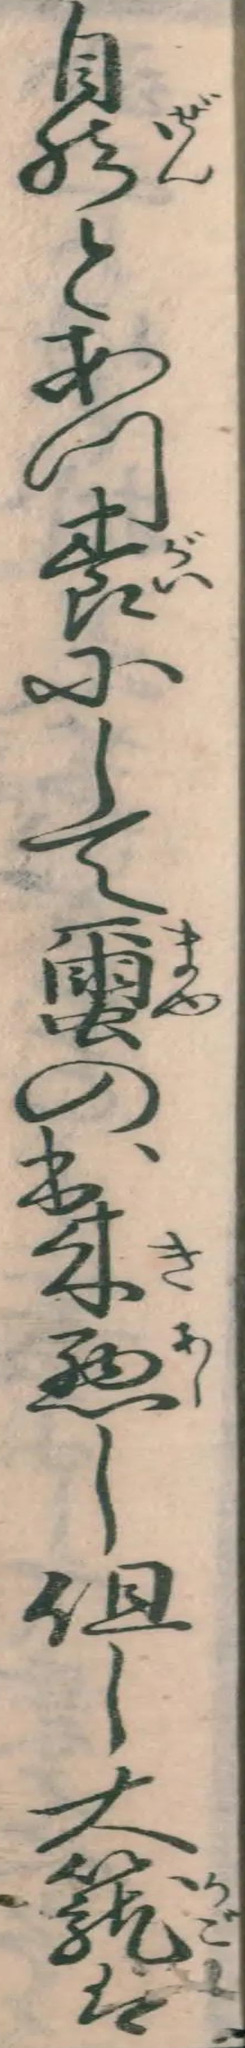自然とあつ養にして繭の出来悪し但し大籠は
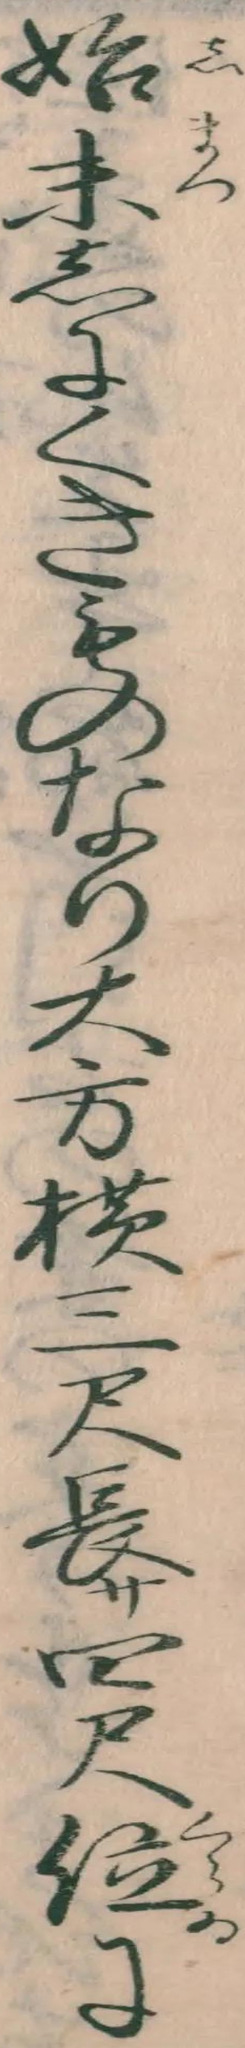始末しにくきものなり大方横三尺長四尺位に
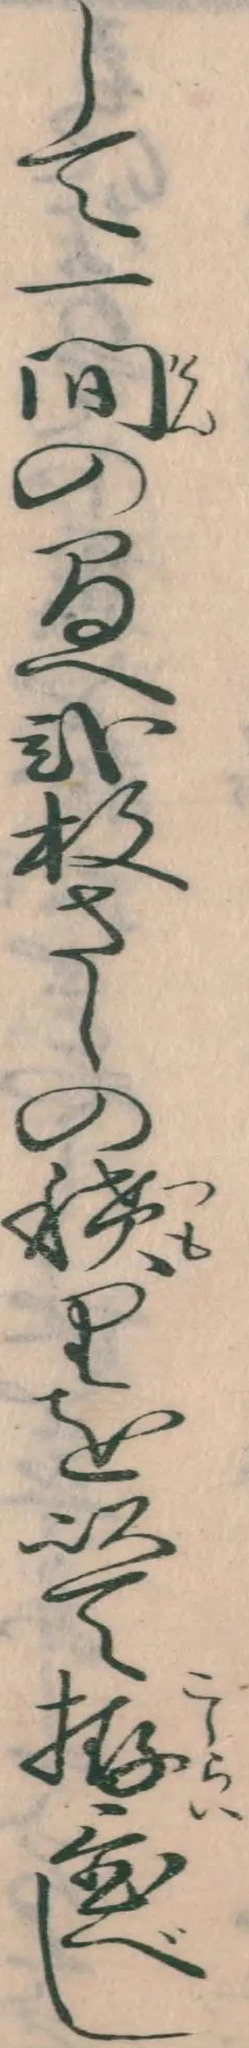して一間の間へ弐枚さしの積りを以て拵置べし
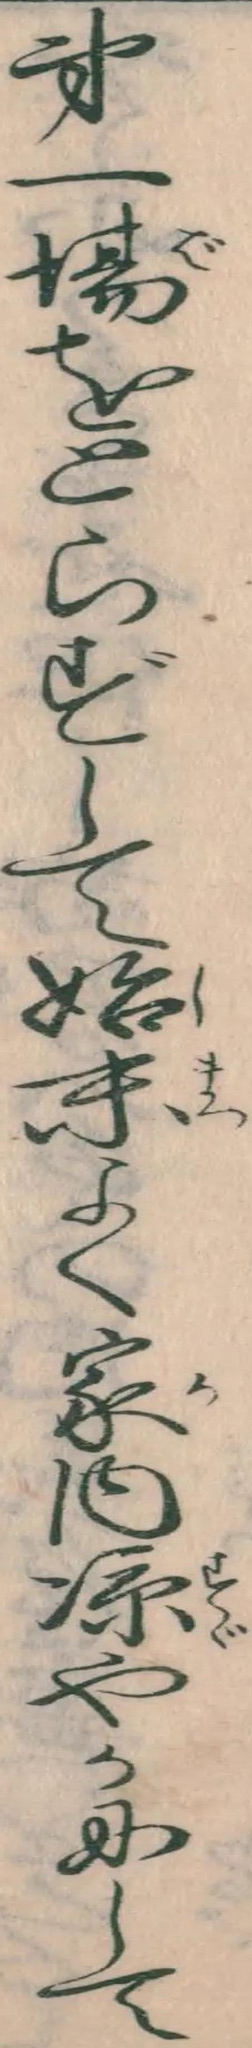第一場をとらずして始末よく家内涼やかにして
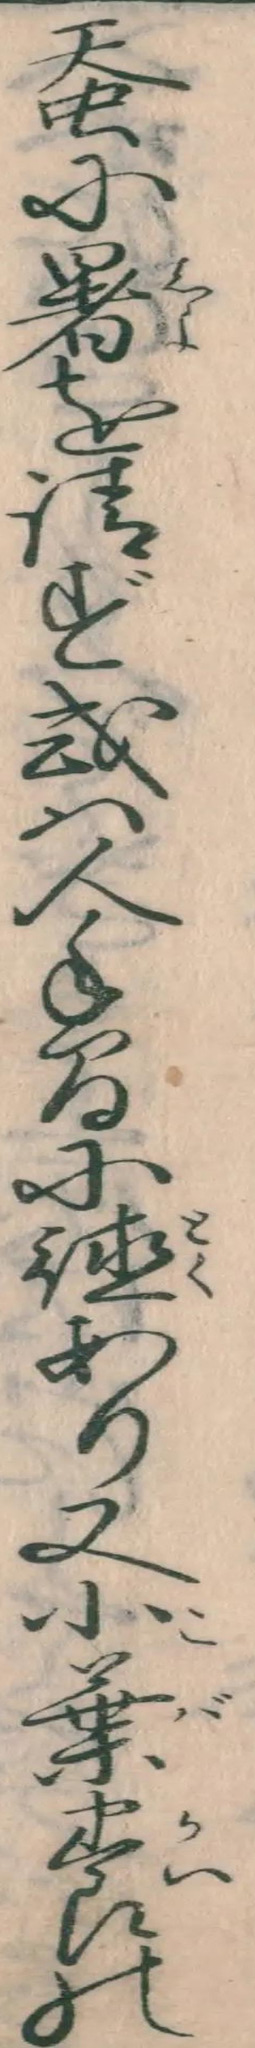蚕に暑を請ず或は人手間に徳あり又小葉養の
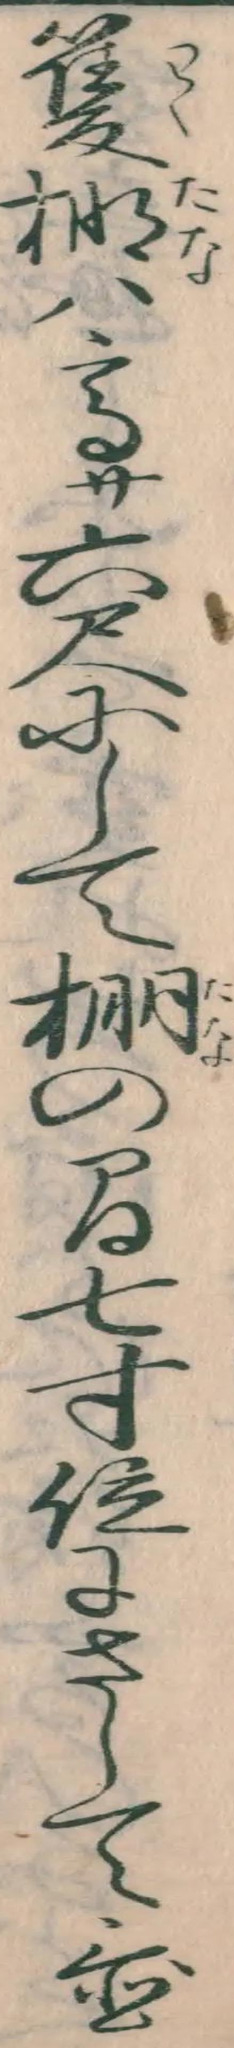篗棚は高六尺にして棚の間七寸位にさして置
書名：新撰養蚕秘書
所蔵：国立国会図書館 National Diet Library, JAPAN
